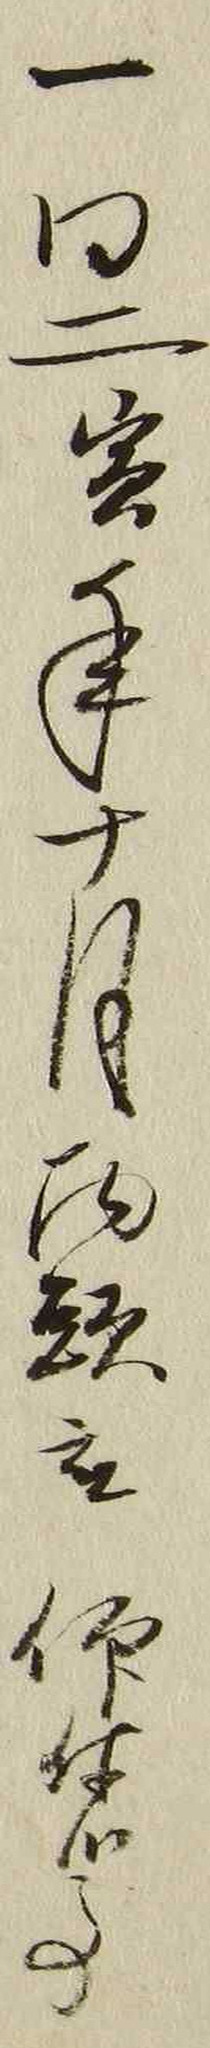一同二寅年十月物頭被仰付候事
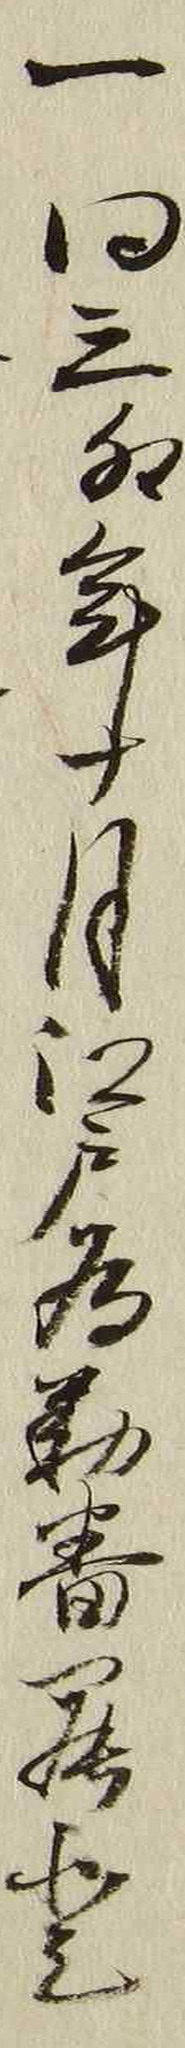一同三卯年十月江戸為勤番罷登
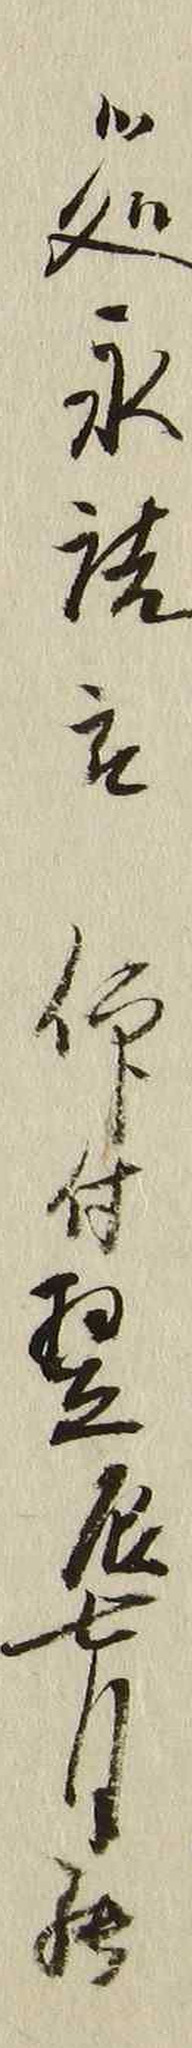候処永詰被仰付翌辰七月罷
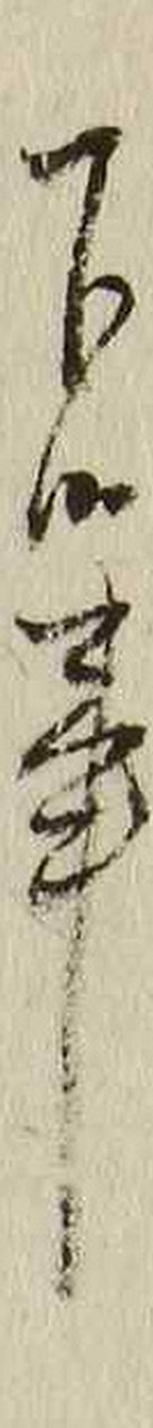下候事
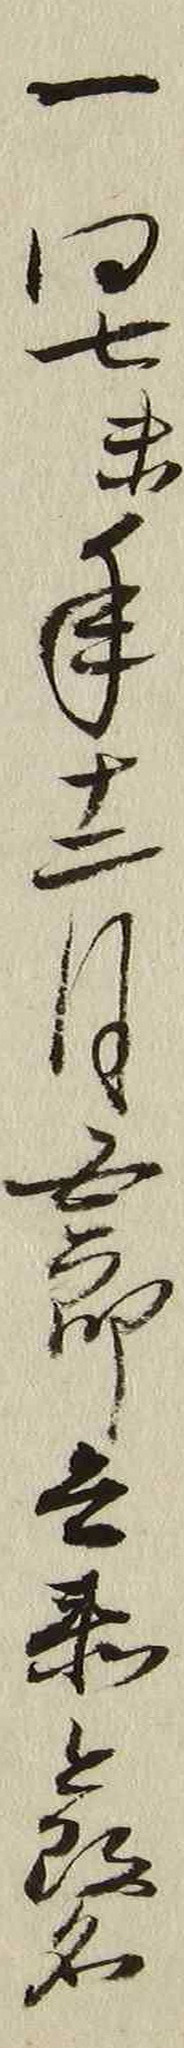一同七未年十二月五郎兵衛と改名
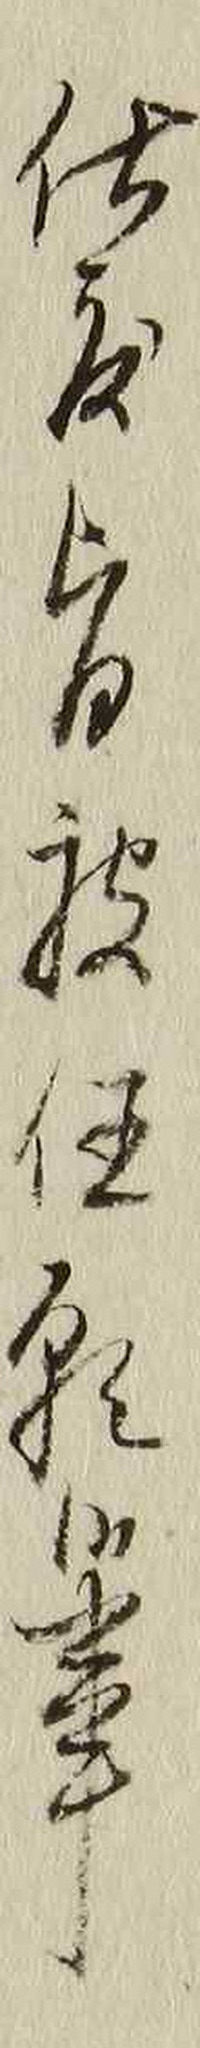仕度旨被任願候事
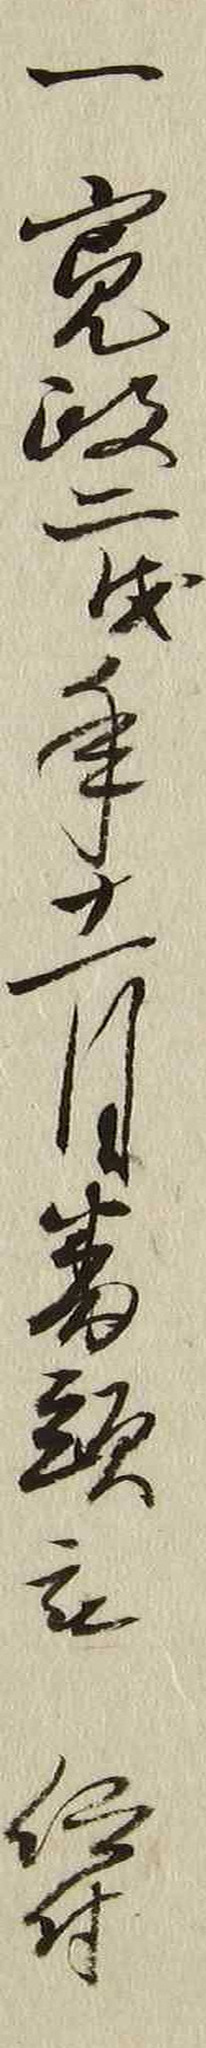一寛政二戌年十一月番頭被仰付
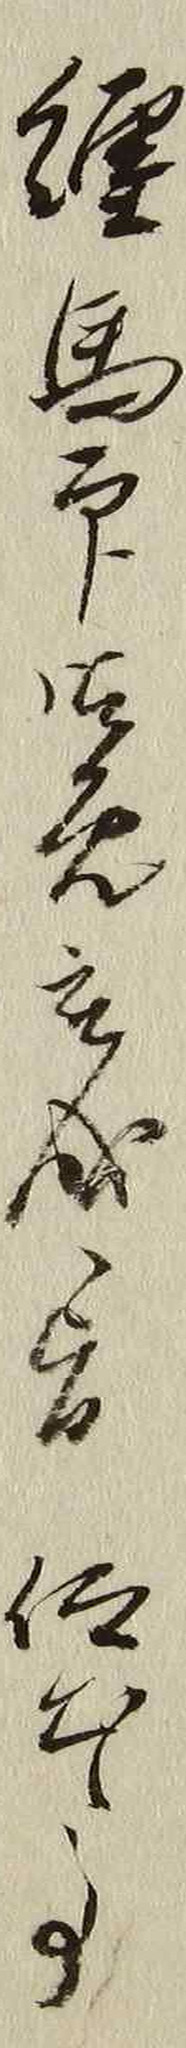纏馬印御免被成候旨仰出候事
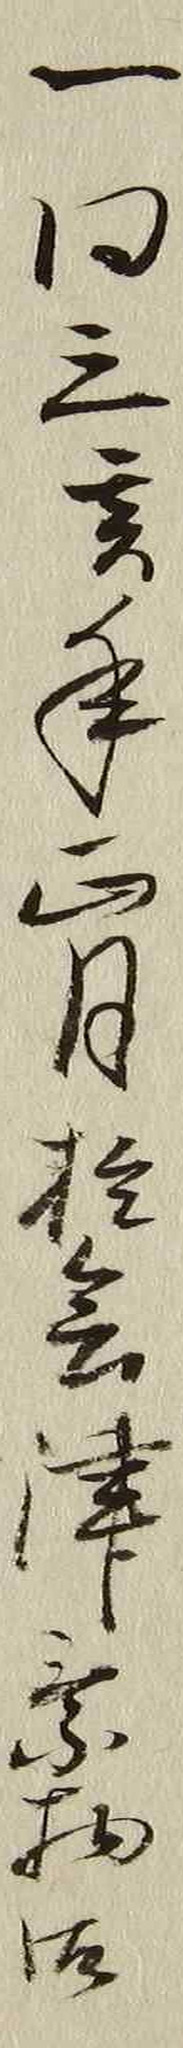一同三亥年正月於会津乗物御
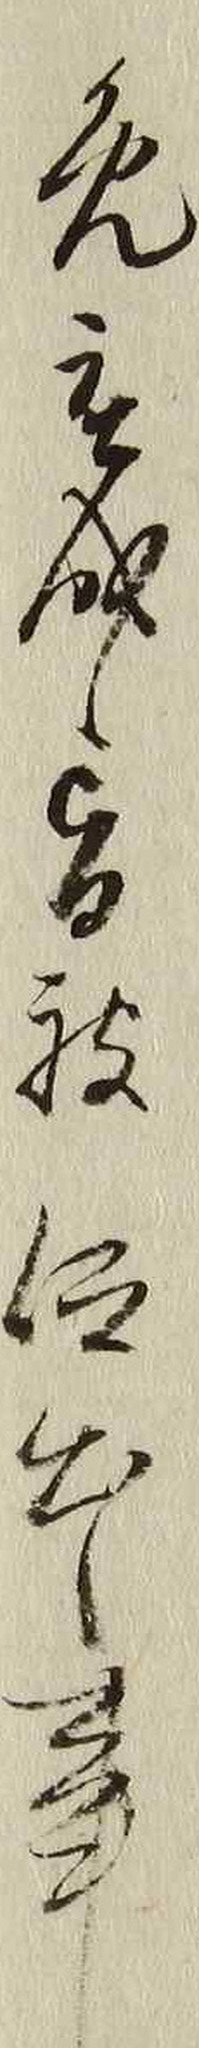免被成候旨被仰出候事
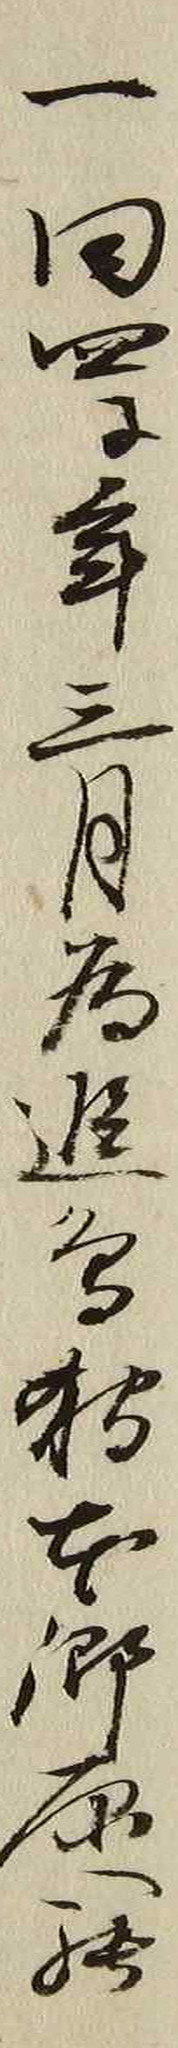一同四子年三月為追鳥狩本郷原へ罷
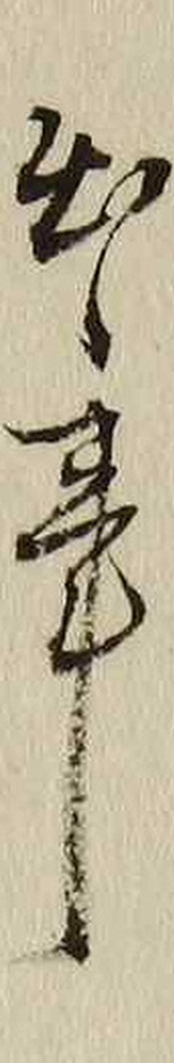出候事
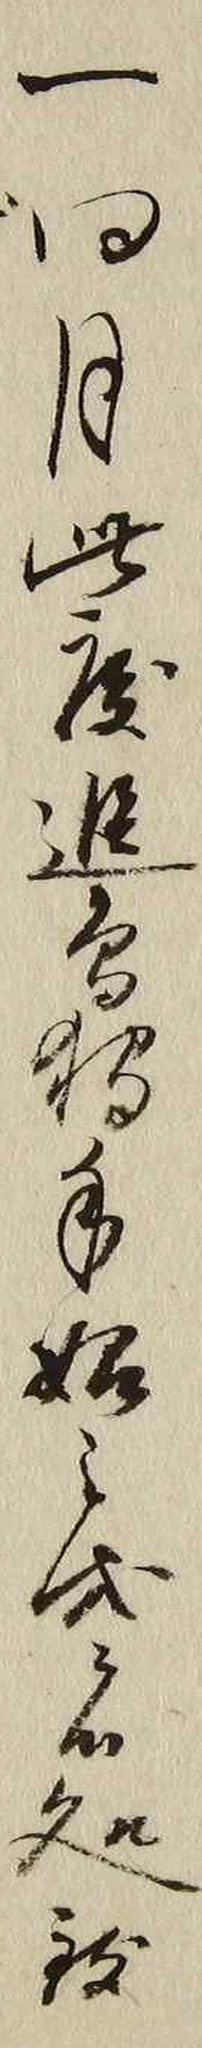一同月此度追鳥狩手始之儀ニ候処致
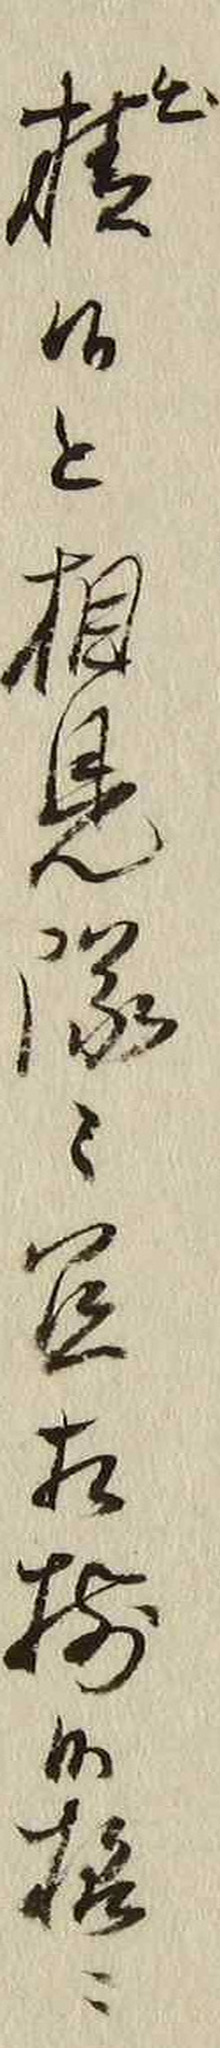出精候と相見隊々宜相揃候様ニ
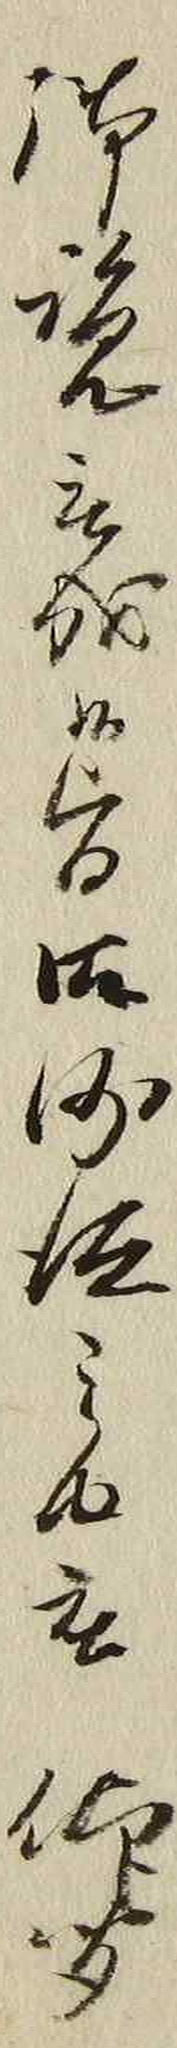御覧被成候旨御沙汰之由被仰聞
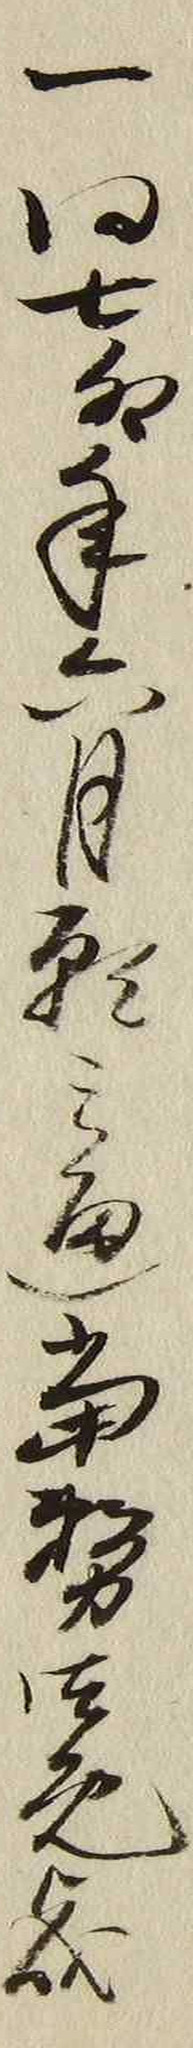一同七卯年六月願之通当務御免被成
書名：諸士系譜　巻之351　す之部1
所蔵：会津若松市立会津図書館
